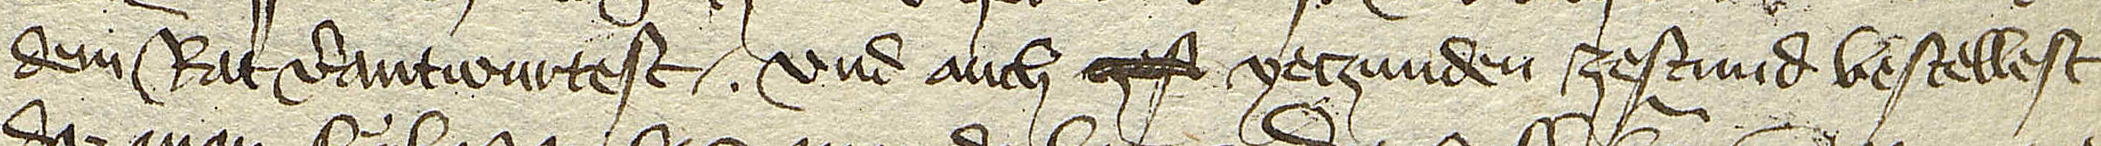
dem Rat v*antwurteſt / . vnd auch cʒeſt yecʒunden cʒeſtund beſtelleſt
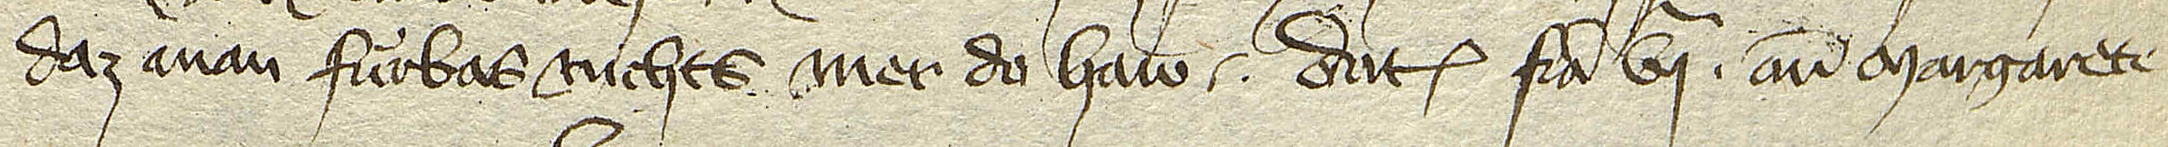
daʒ man fürbas nichts mer do haw / . Dat* fia* vi* . an* Margarete
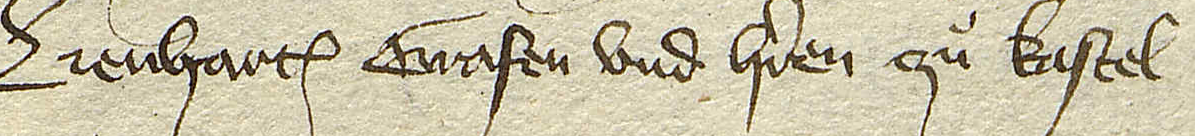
Lienhart* Grafen vnd hr*en cʒü kaſtel
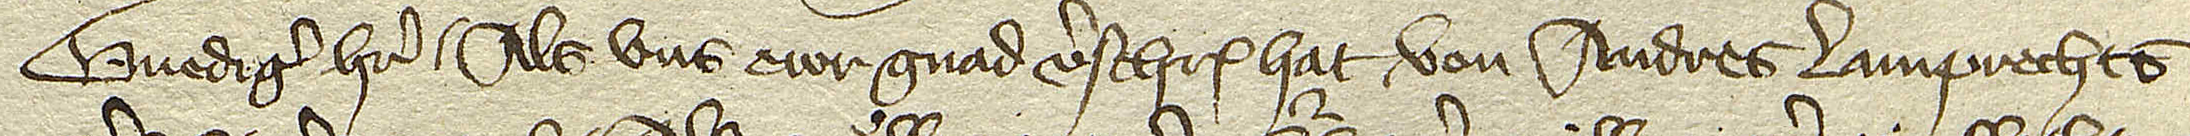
Gnedig* hr* / Als vns ewr gnad v*ſchr* hat / von Anders Lamprechts
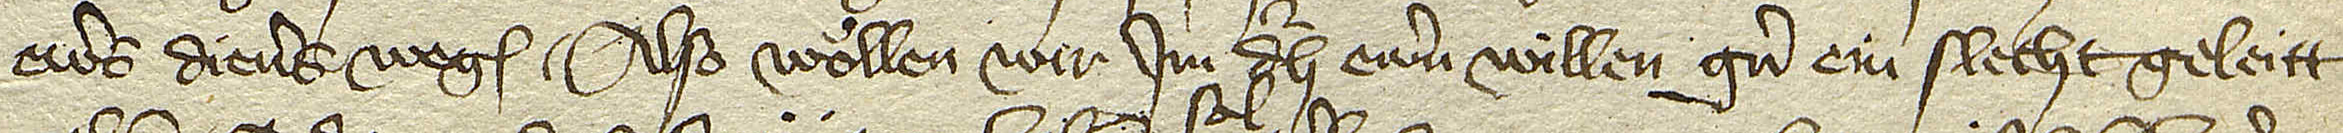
ew*s dien*s weg* / Alſo wöllen wir Im d*h ew*n willen gn* ein ſlecht geleitt
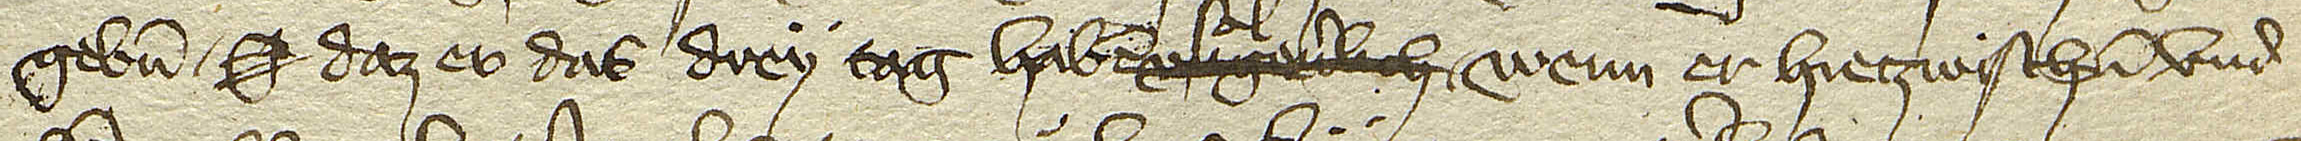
gebn* / A daʒ er das drey tag habe* vngeu*lich / wenn er hiecʒwiſchn* vnd
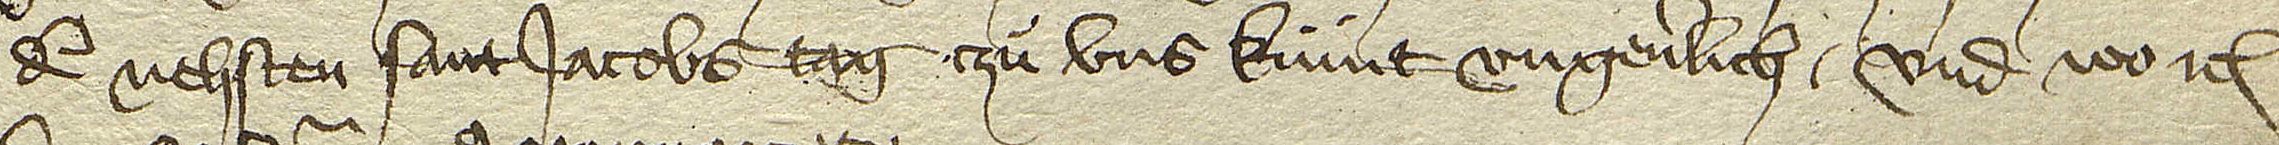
d* nehſten ſant Iacobs tag cʒü vns kümt vngeu*lich / vnd wo ec*
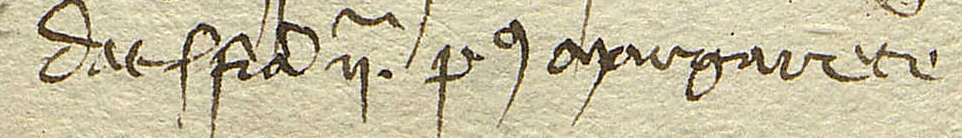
dat* fia* ii* . p* Margarete
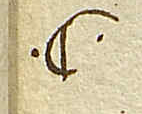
. C .
